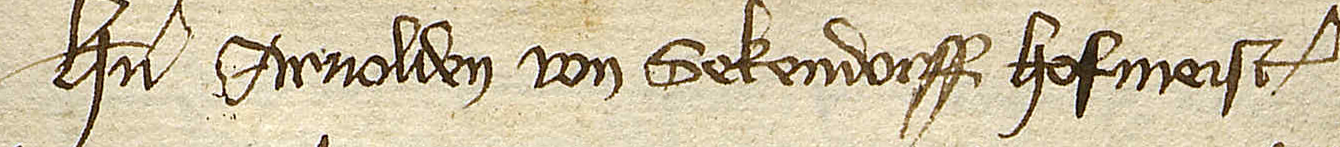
Hn* Arnolden von Sekendorff hofmeiſt*
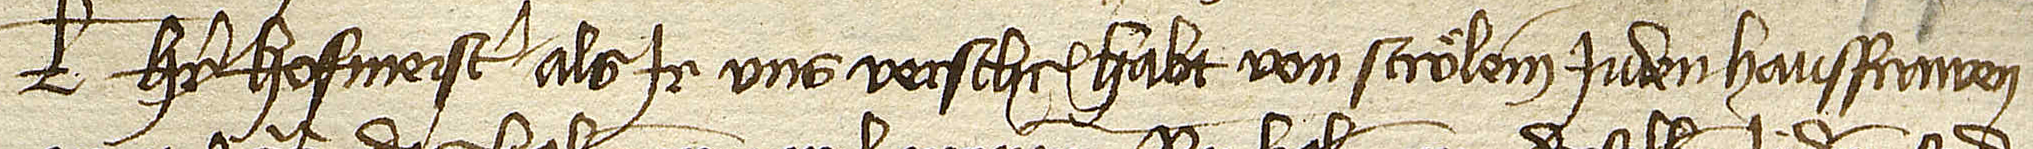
L* hr* hofmeiſt* / als Ir vns verſchr* habt von ſtrölein Iuden hauſfrawen
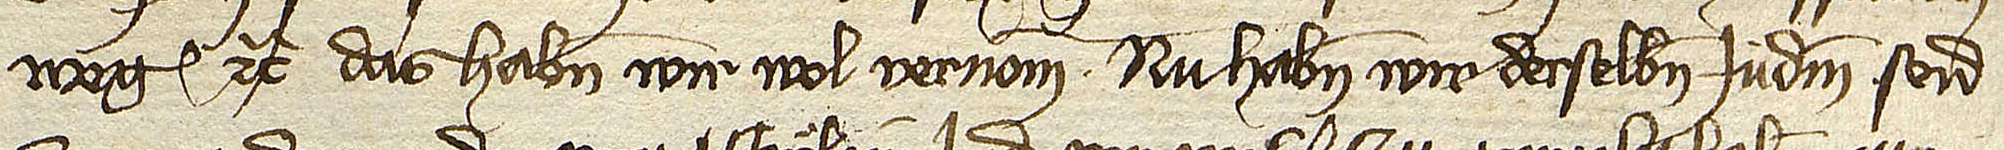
weg* ec* das habn* wir wol vernom* . Nu habn* wir derſelbn* Iüdin ſeid
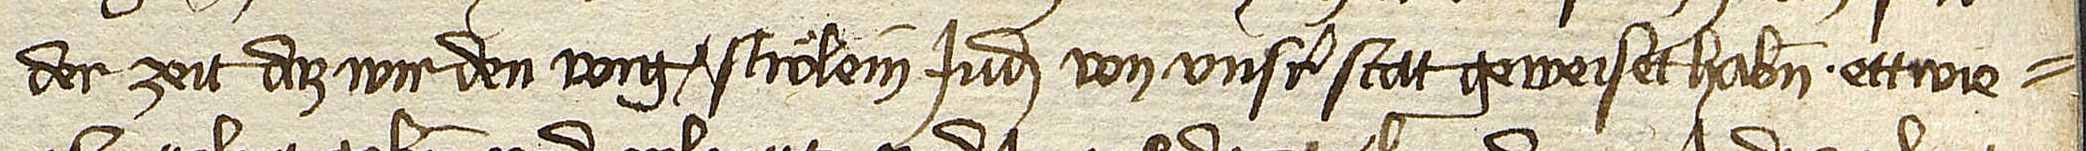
der ʒeit daʒ wir den vorg* ſtrölein Iud* von vnſr* ſtat geweiſet habn* . ettwie =
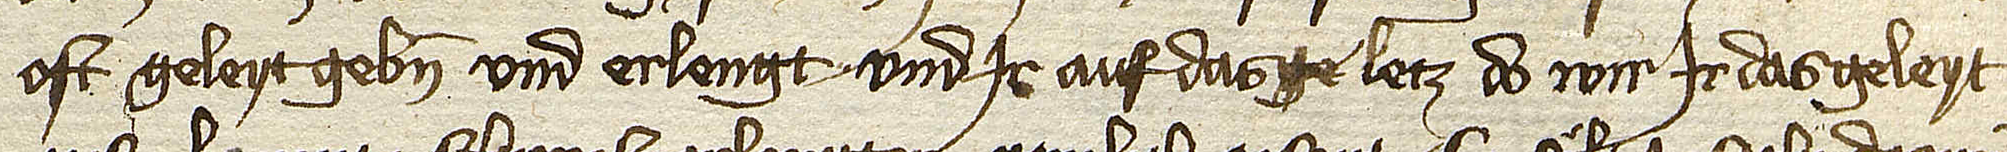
oft geleyt gebn* vnd erlengt . vnd Ir auf das ge lecʒ do wir Ir das gelyt
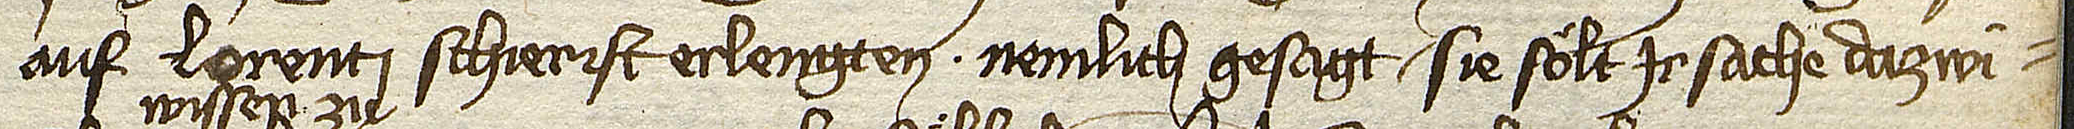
auf Lorenti ſchieriſt erlengten . nemlich geſagt / ſie ſölt Ir ſache daʒwi =
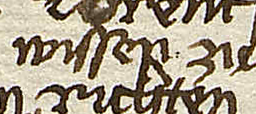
wiſſen ʒu
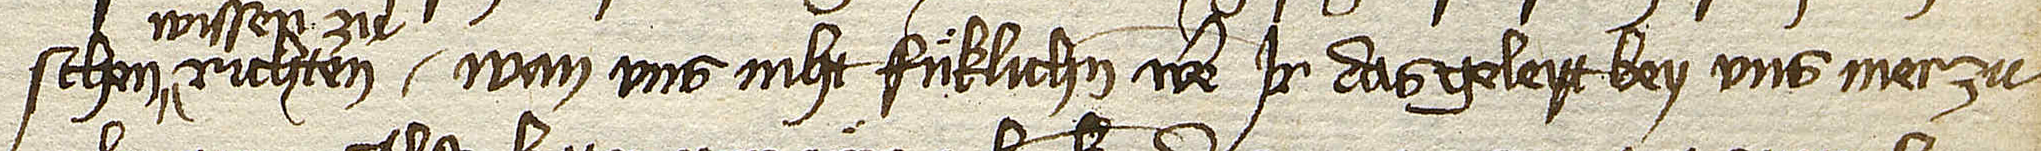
ſchen richten / wan vns niht füklichn* w*e Ir das geleyt bey vns mer ʒu
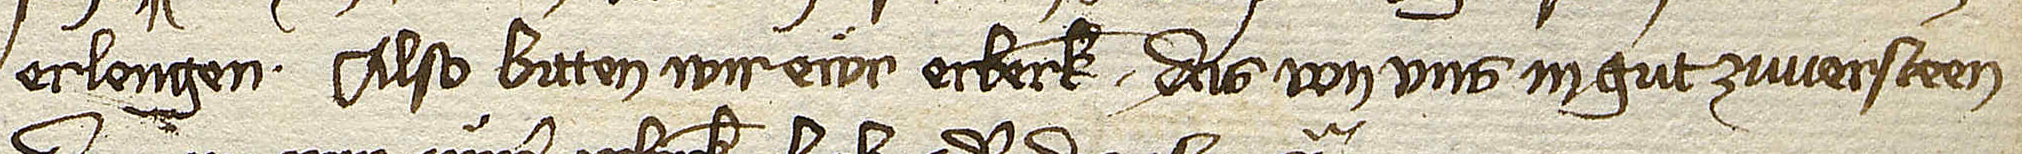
erlengen . Alſo bitten wir ewr erberk* / das von vns in gut ʒuuerſteen
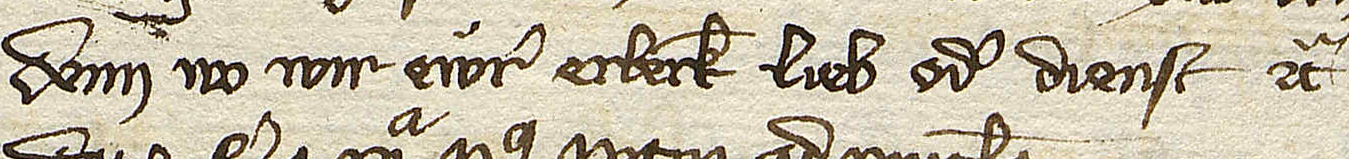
Denn wo wir ewr* erberk* lieb od* dienſt ec*
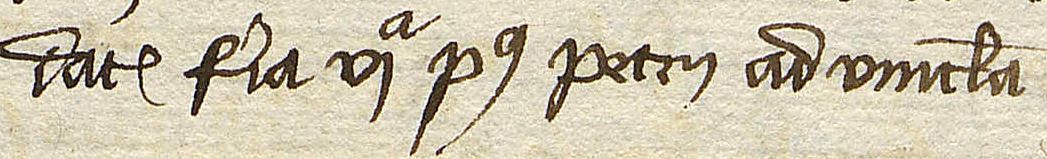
Dat* f*ia vi* p* Petri ad vincla*
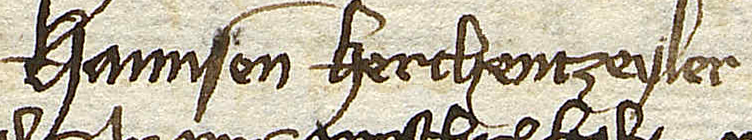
Hannſen Herchencʒeyler
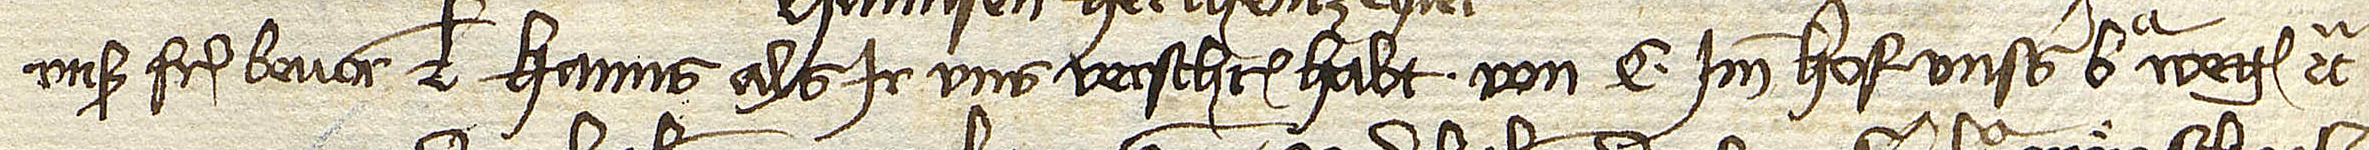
vnſ* fr* beuor L* Hanns als Ir vns verſchr* habt . von C . Im*hof vnſ*s b* weg* ec*
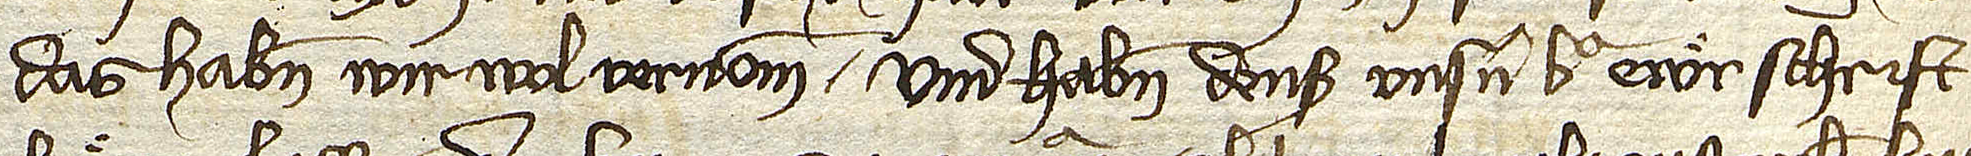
das habn* wir wol vernom* / Vnd habn* denſ* vnſn* b* ewr ſchrift
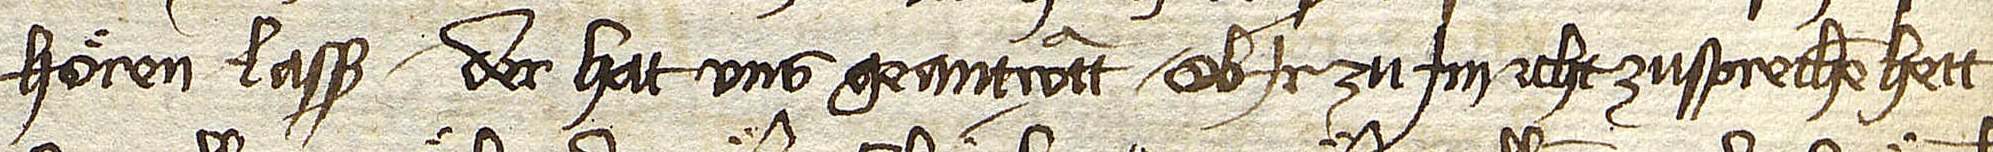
hören laſſ* / Der hat vns geantw*t / Ob Ir ʒu Im icht ʒuſpreche* hett
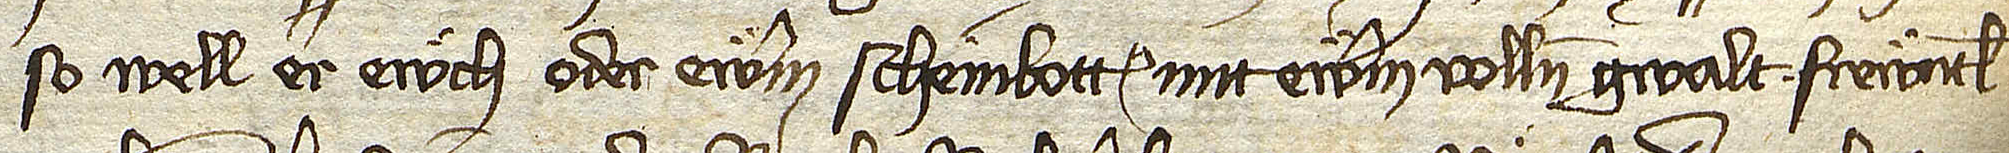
ſo well er ewch oder ew*m ſcheinbott* mit ew*m volln* gwalt . frewntl*
